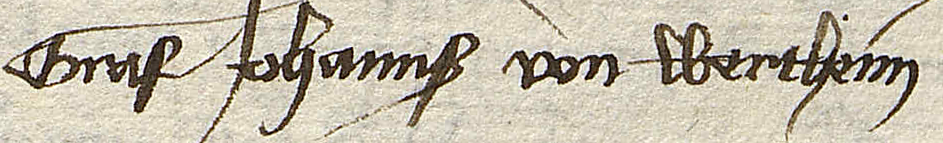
Graf Iohannſ* von Wertheim
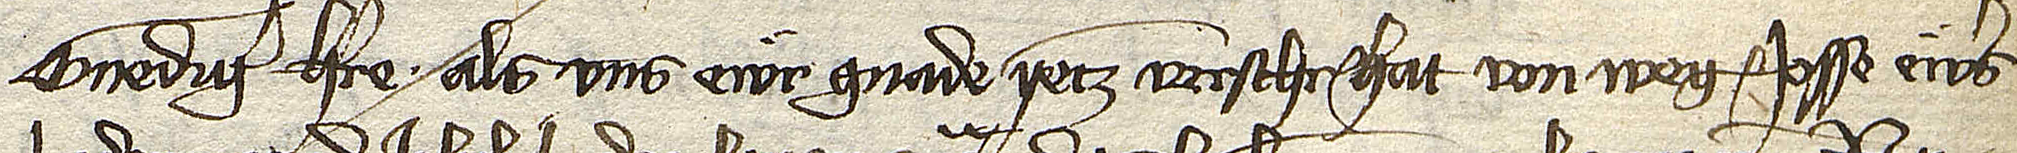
Gnedig* h*re . als vns eẅr gnade yecʒ* verſchr* hat von weg* Ioſſe eẅ*s
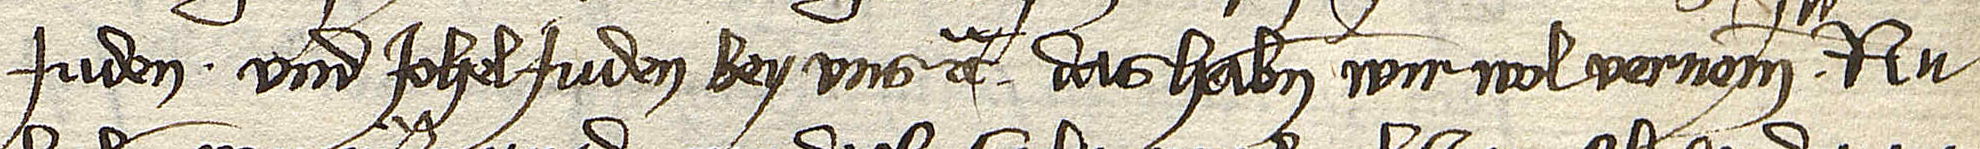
Iuden . vnd Iohel Iuden bey vns ec* . das habn* wir wol vernom* . Nu
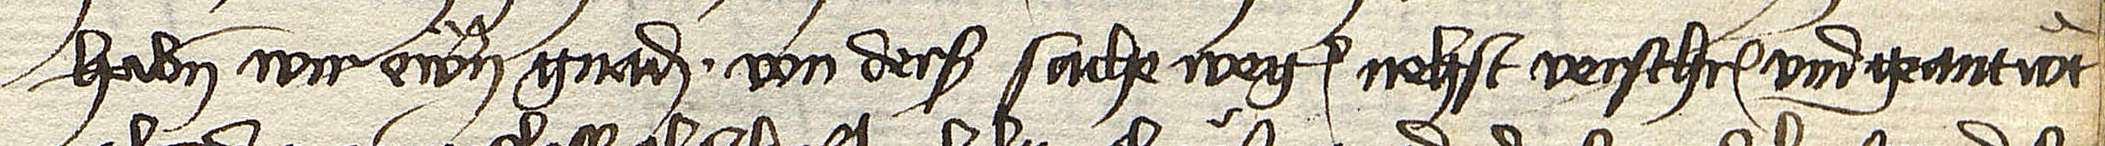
habn* wir eẅ*n gnad* . von derſ* ſache weg* nehſt verſchr* vnd geantw*t
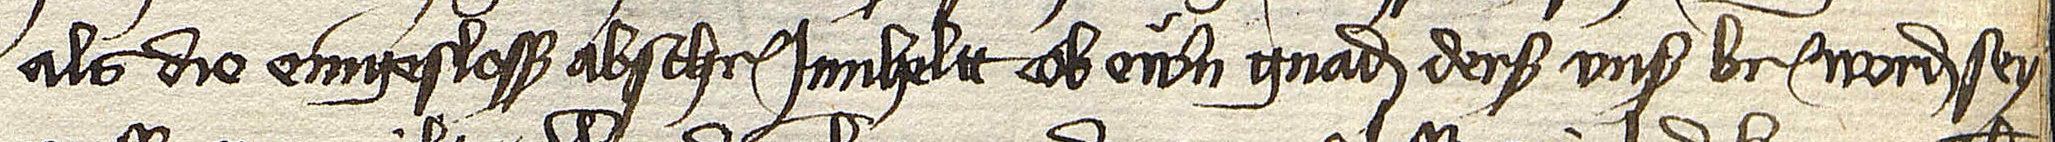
als die eingeſloſſ* abſchr* Innheltt / ob eẅ*n gnad* derſ* vnſ* br* word* ſey
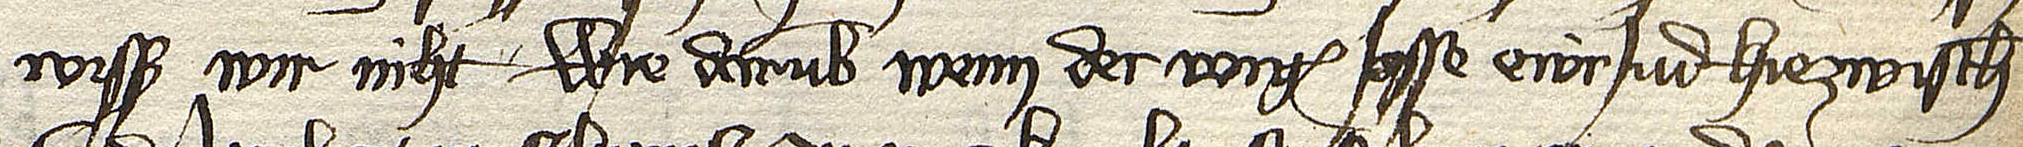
wiſſ* wir niht / Wie darub* wenn der vorg* Ioſſe eẅr Iud hieʒwiſch*
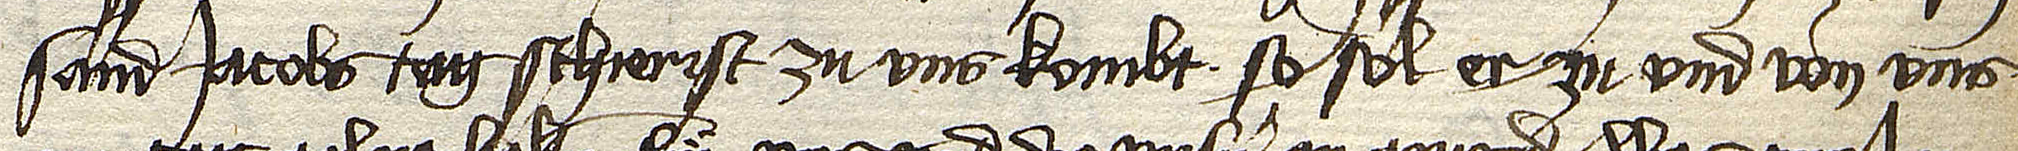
ſand Iacob tag ſchieriſt cʒu vns kombt . ſo ſol er ʒu vnd von vns
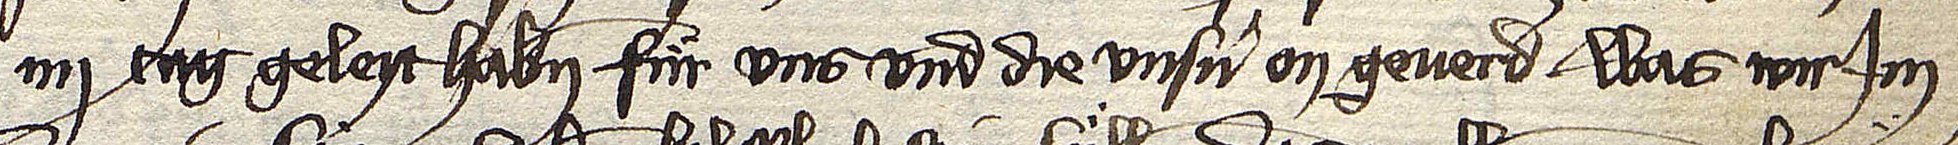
iiii tag geleyt habn* für vns vnd die vnſn* on geuerd / Was wir Im
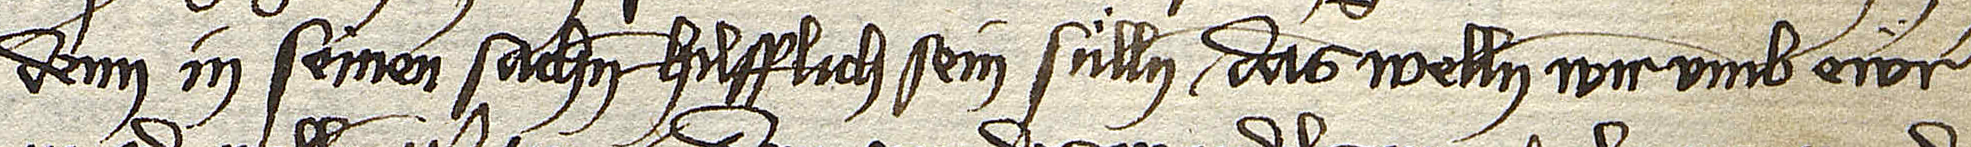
denn in ſeinen ſachn* hilfflich ſein ſülln* / das welln* wir vmb eẅr*
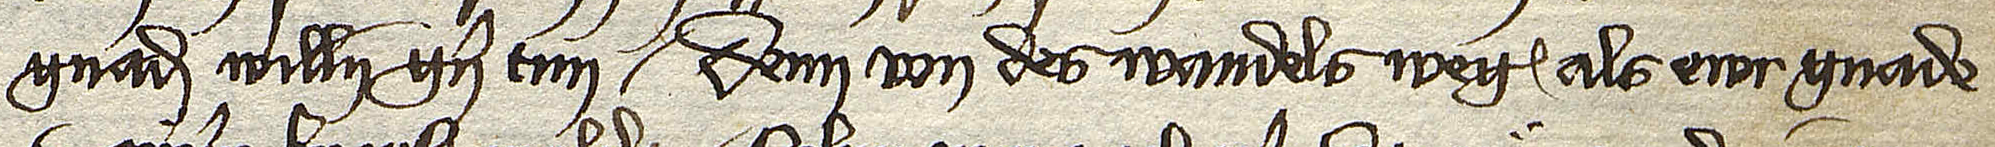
gnad* willn* g*n tun / Denn von des wandels weg* als ewr gnade
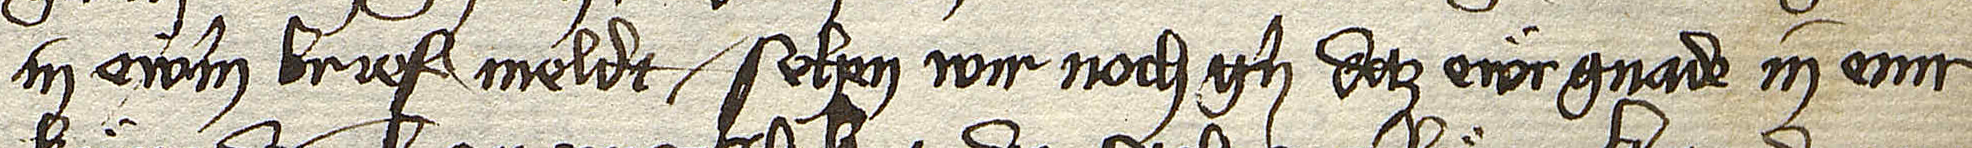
in eẅ*m brief meldt / ſehen wir noch g*n daʒ eẅr gnade in einr
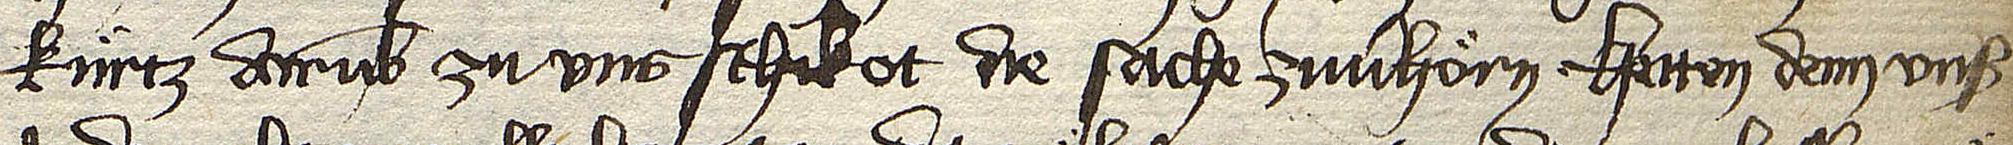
kürcʒ darub* ʒu vns ſchiket die ſache ʒuu*hörn . Hetten denn vnſ*
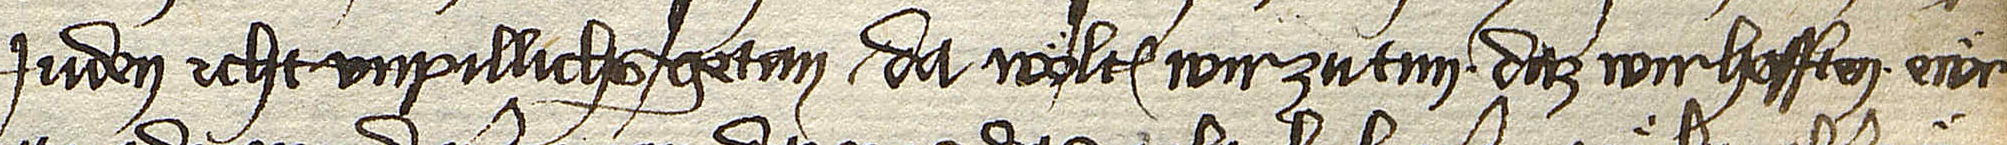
Iuden icht vnpillichs getan / da wölt* wir ʒu tun . daʒ wir hofften . eẅr
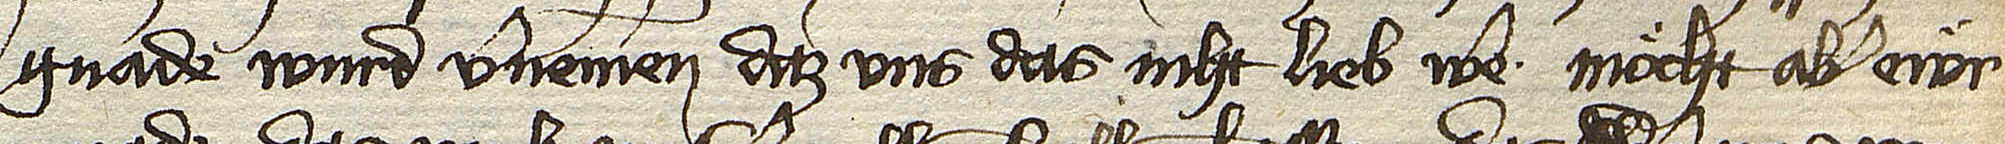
gnade wurd v*nemen daʒ vns das niht lieb w*e . möcht ab* eẅr
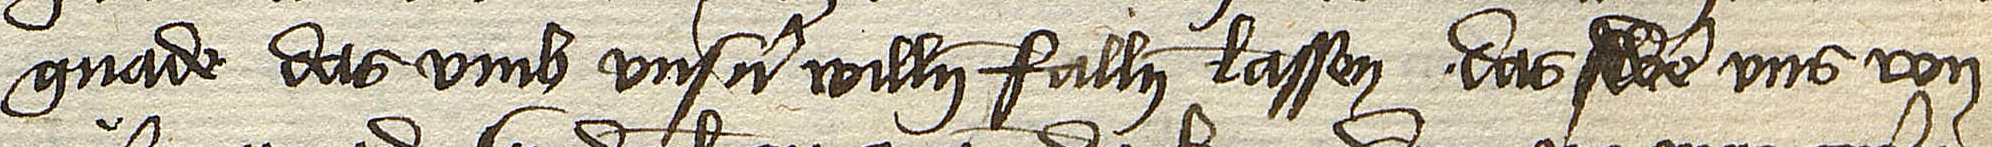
gnade das vmb vnſn* willn* falln* laſſen . Das w*e vns von
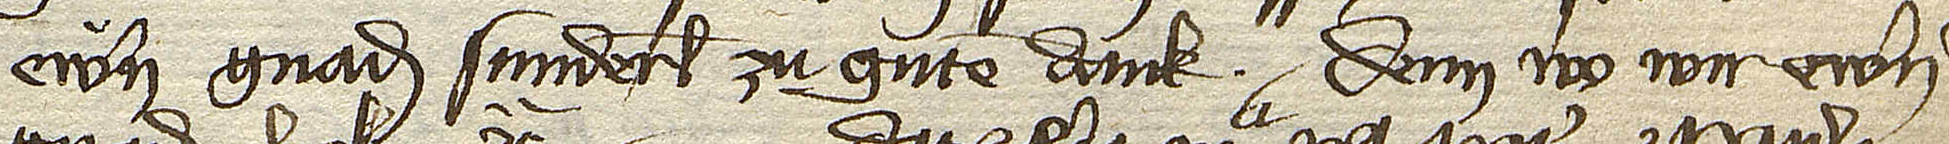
eẅ*n gnad* ſundel* ʒu gute* dank . / Denn wo wir ew*n
